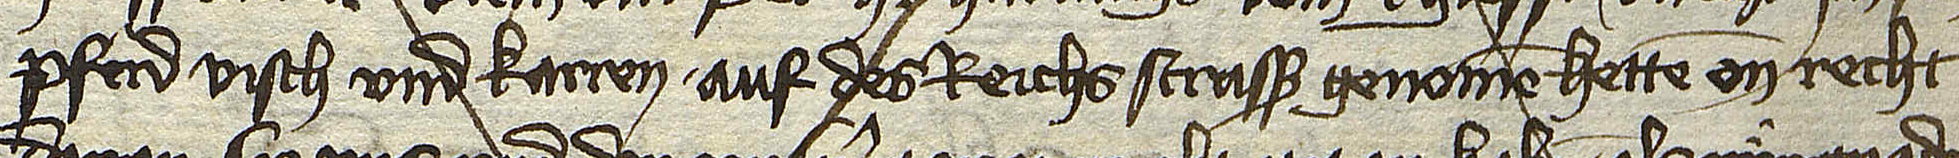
pferd viſch vnd karren / auf des Reichs ſtraſſ* genome* hette* on recht
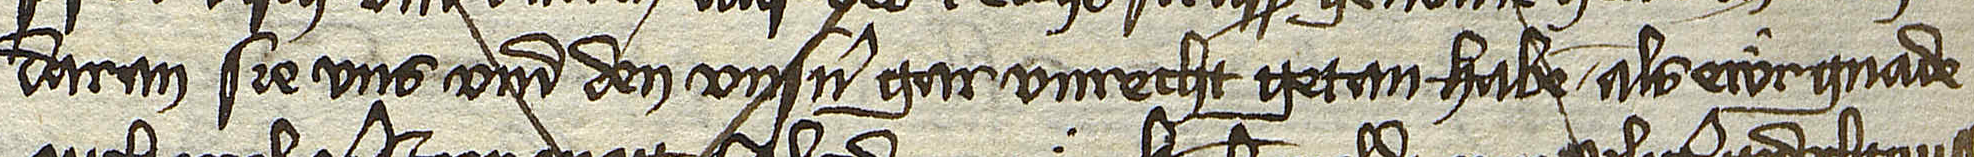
daran ſie vns vnd den vnſn* gar vnrecht getan habe* / als ewr gnade
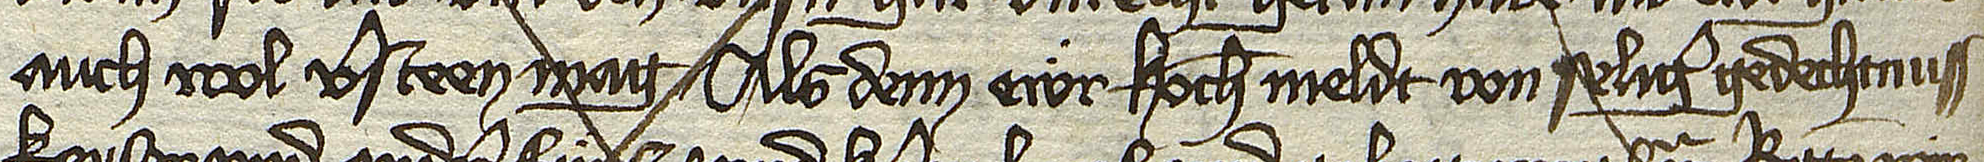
auch wol v*ſteeen mag / Als denn ewr hoch* meldt von ſelig* gedechtnuſſ
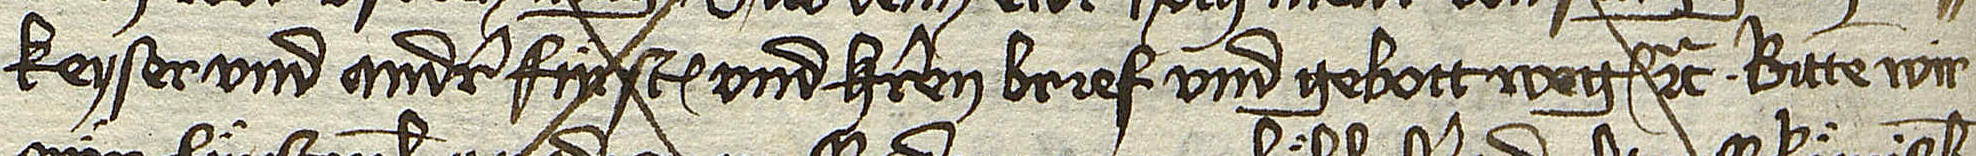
keyſer vnd andr* fürſt* vnd hr*en brief vnd gebott weg* ec* . Bitte* wir
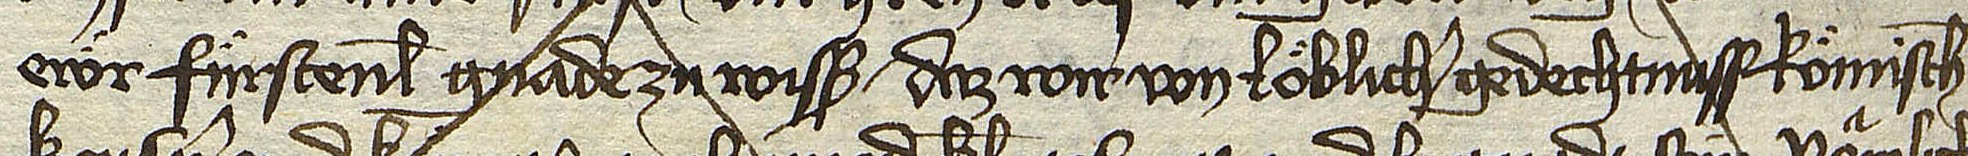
ewr fürſtenl* gnade ʒu wiſſ* / daʒ wir von löblich* gedechtnuſſ Römiſch*
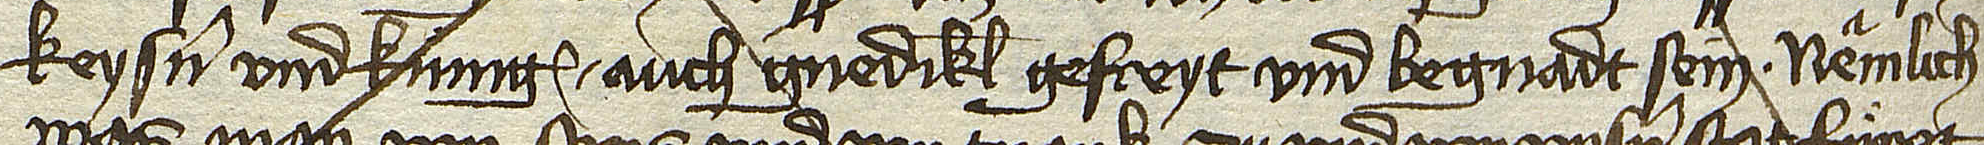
keyſn* vnd künig* / auch gnedikl* gefreyt vnd begnadt ſein . Nëmlich
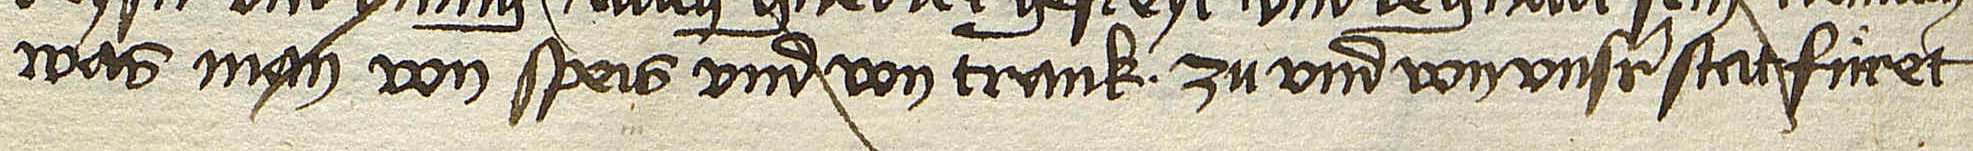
was man von ſpeis vnd von trank . ʒu vnd von vnſr* ſtat füret
